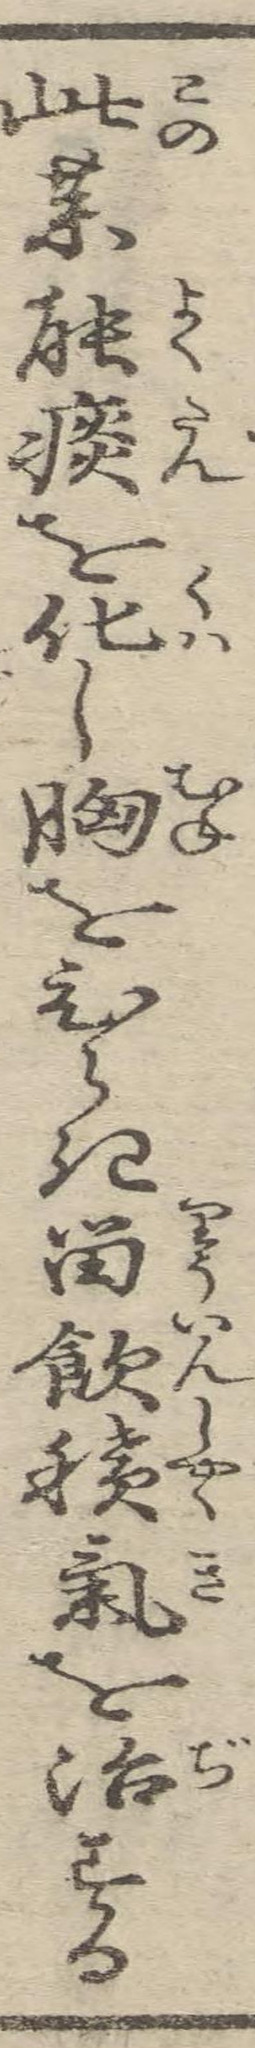此薬能痰を化し胸をひらき留飲積気を治する
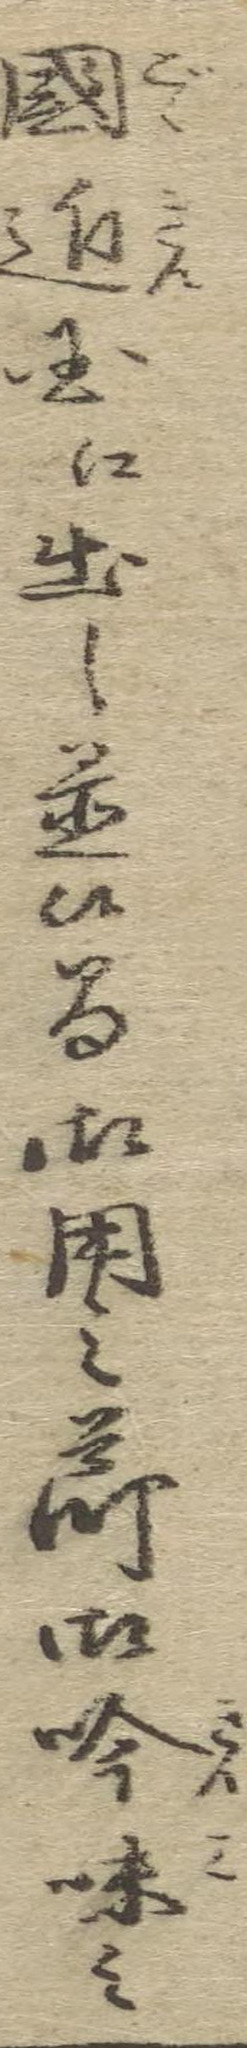国近国に出し置候間御用之節御吟味之
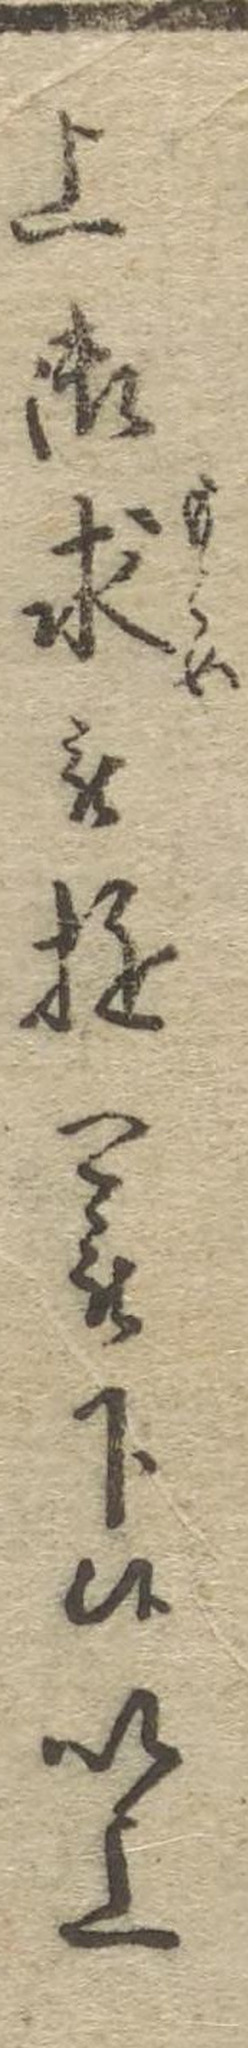上御求被遊可被下候以上
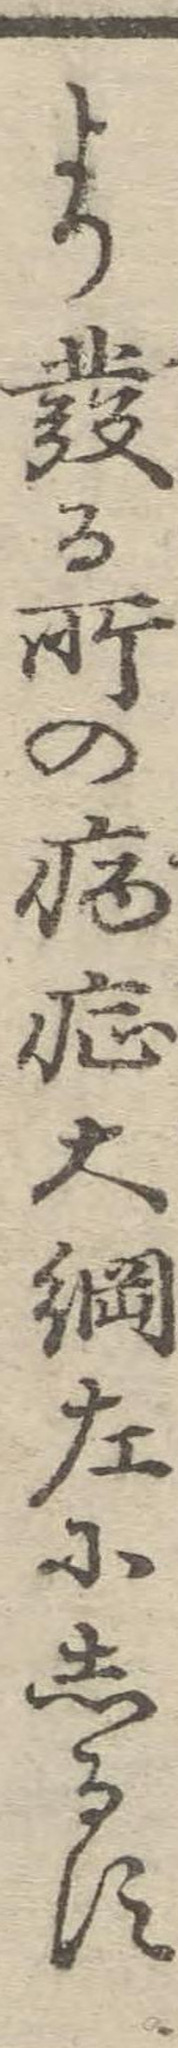より発る所の病症大綱左にしるす
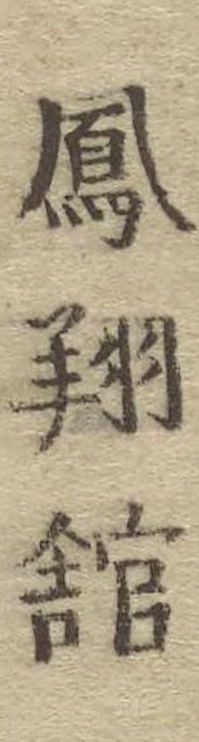鳳翔館
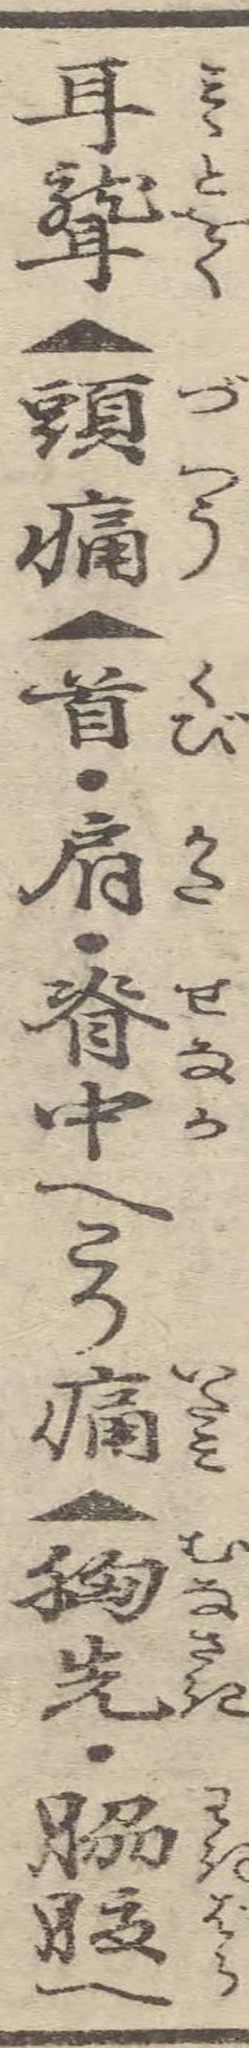耳聾▲頭痛▲首・肩・脊中へこり痛▲胸先・脇腹へ
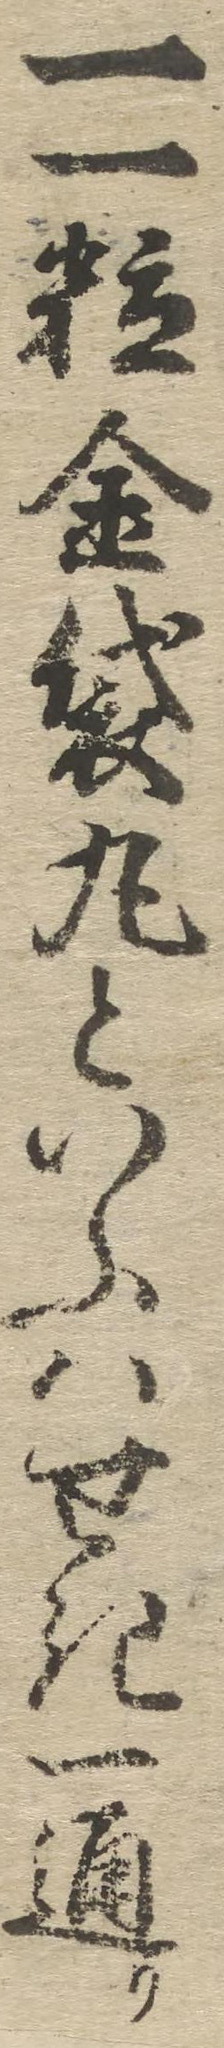一一粒金袋丸といふはせき一通り
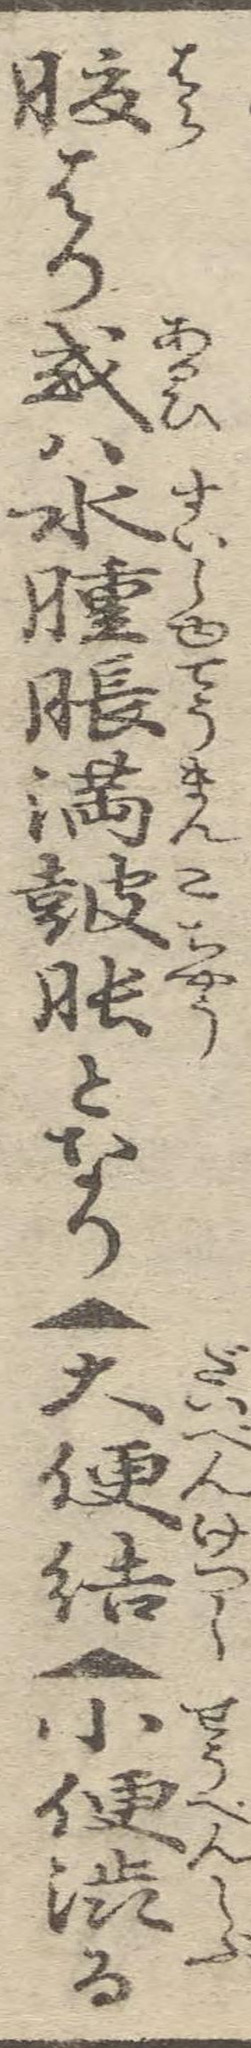腹はり或は水腫脹満皷脹となり▲大便結▲小便渋る
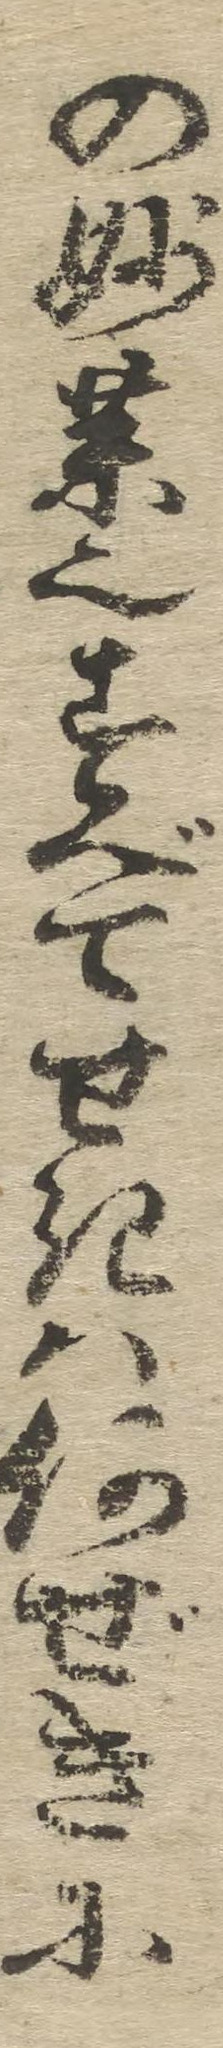の妙薬也すべてせきは何ぜきに
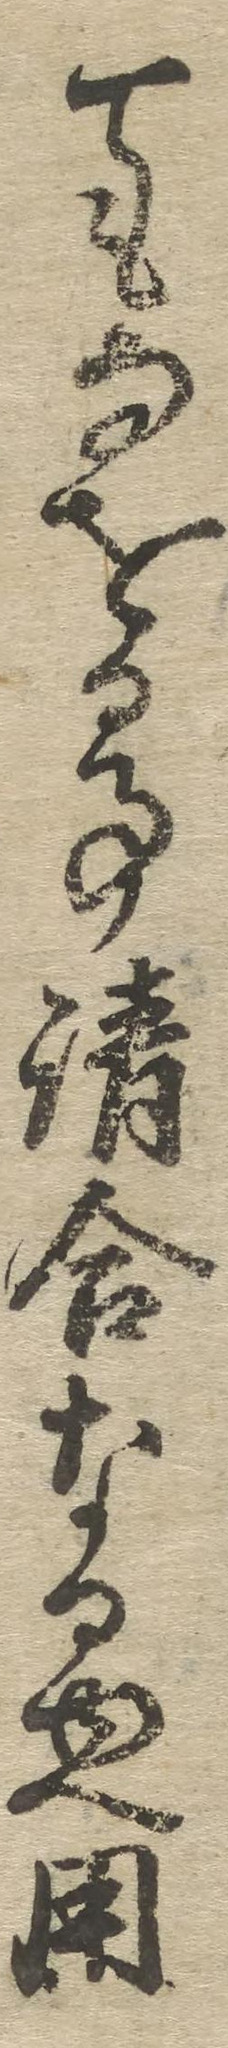てもなをる事請合んばるゆへ用
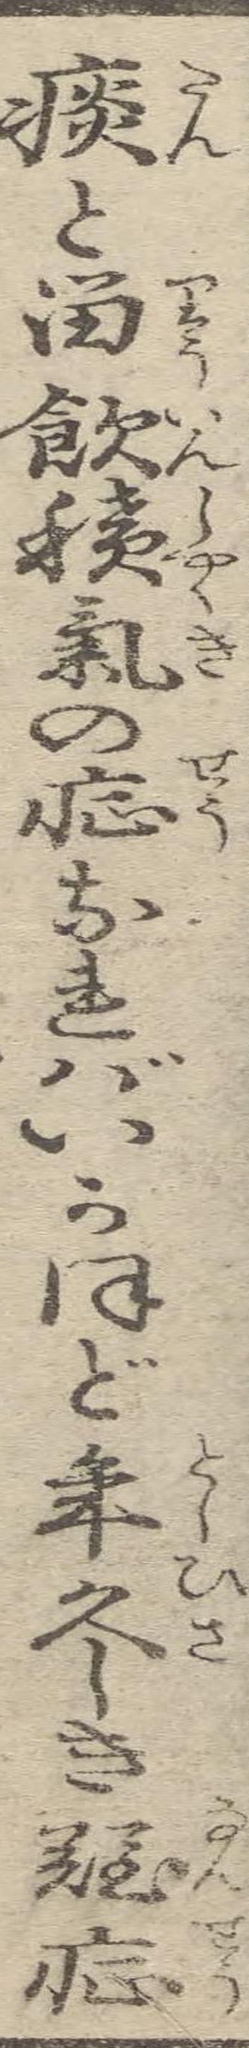痰と留飲積気の症なればいかほど年久しき難症
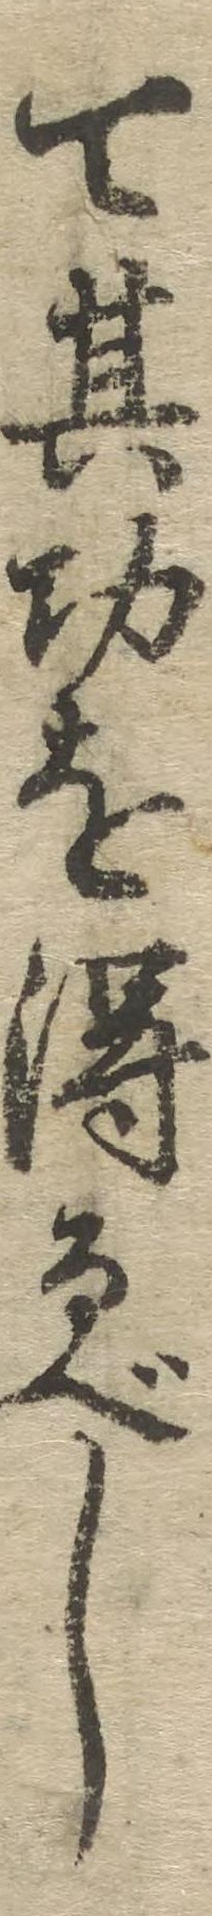て其功を得るべし
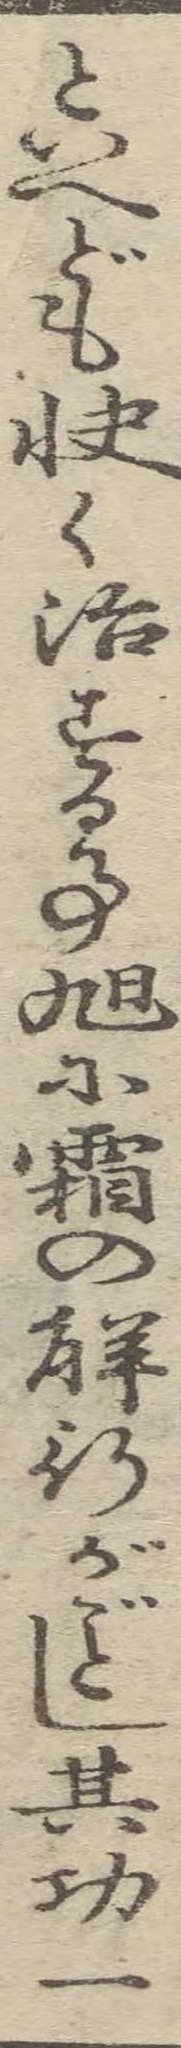といへども快く治する事旭に霜の解行がごとし其功一
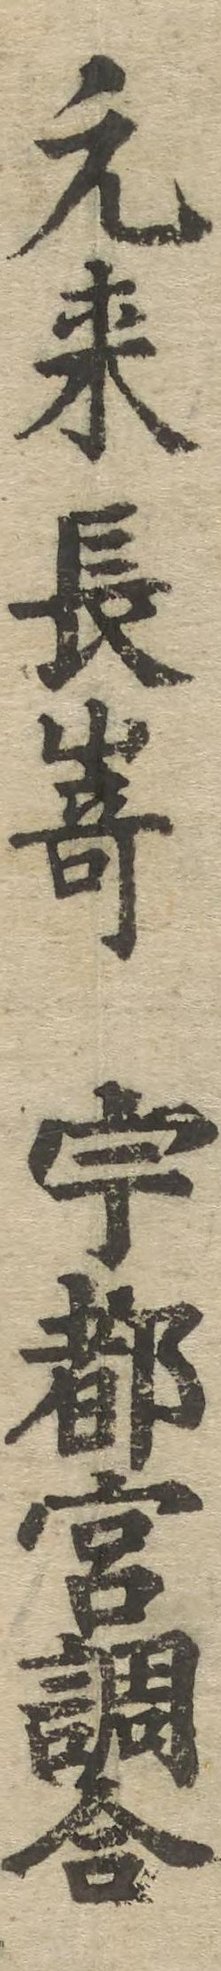元来長崎宇都宮調合
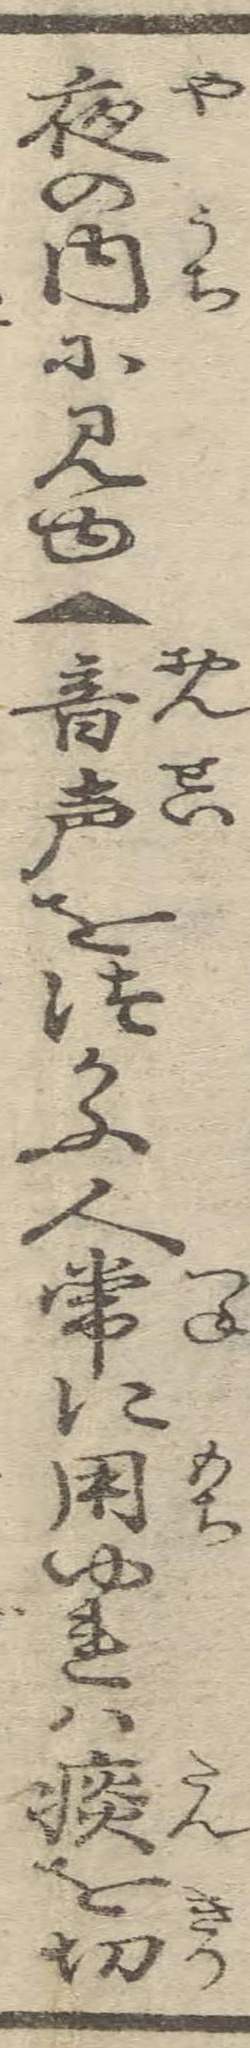夜の内に見ゆ▲音声をつかふ人常に用ゆれは痰を切
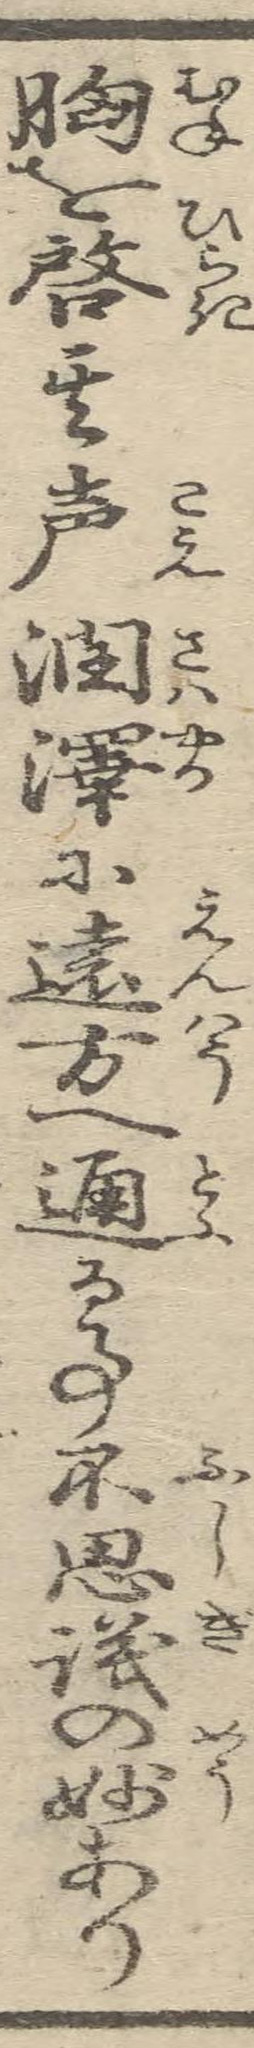胸を啓其声潤沢に遠方へ通る事不思議の妙あり
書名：浪華薬種問屋能書張交帖. 二
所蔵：国立国会図書館 National Diet Library, JAPAN
